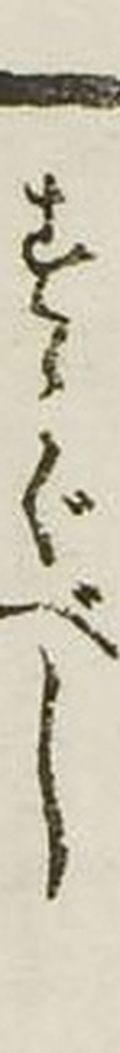すゝぐべし
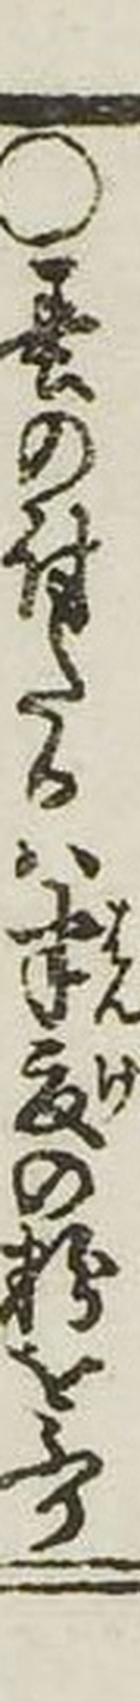〇墨の付たるは半夏の粉をふり
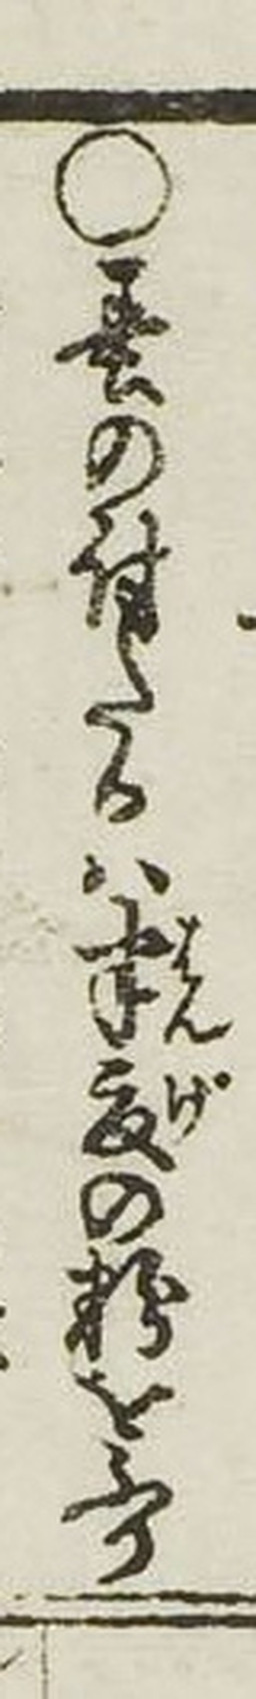〇墨の付たるは半夏の粉をふり
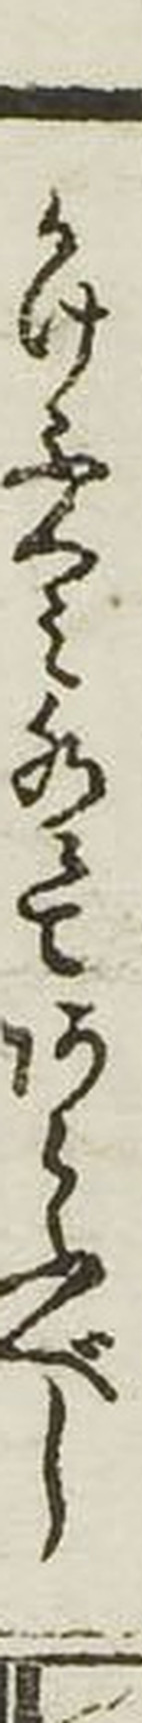かけふくみ水にてあらふべし
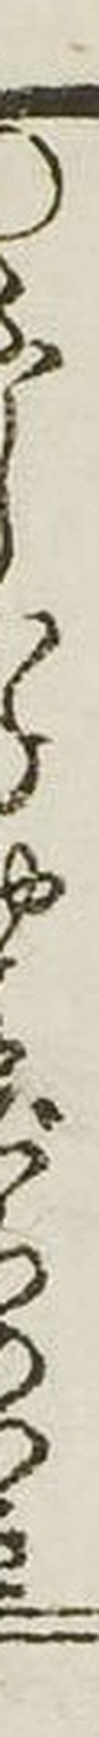〇ふしかねおはぐろのつき
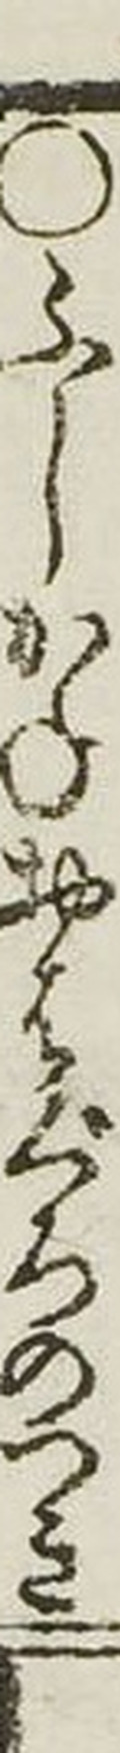〇ふしかねおはぐろのつき
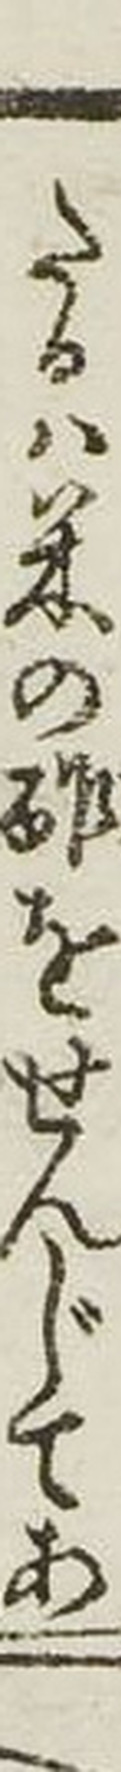たるは米の酢をせんじてあ
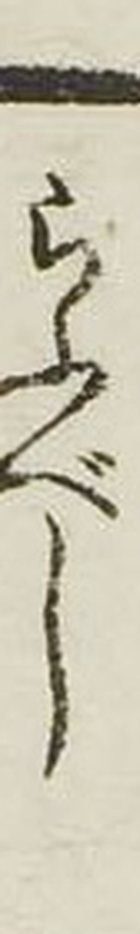らふべし
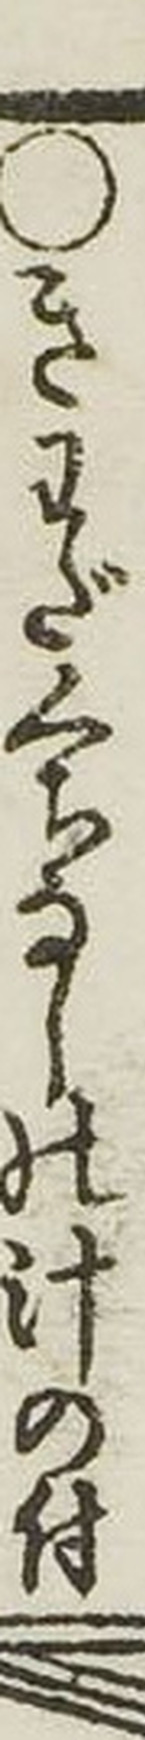〇きわだくちなしのしるの付
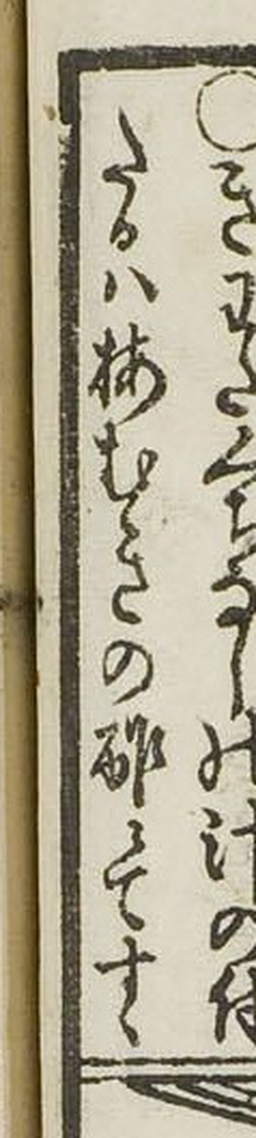たるは梅むきの酢にてすゝ
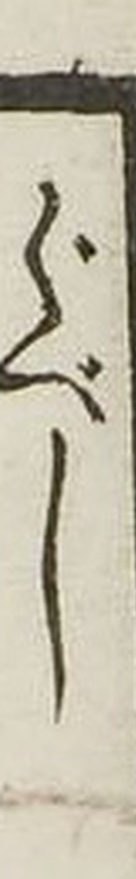ぐべし
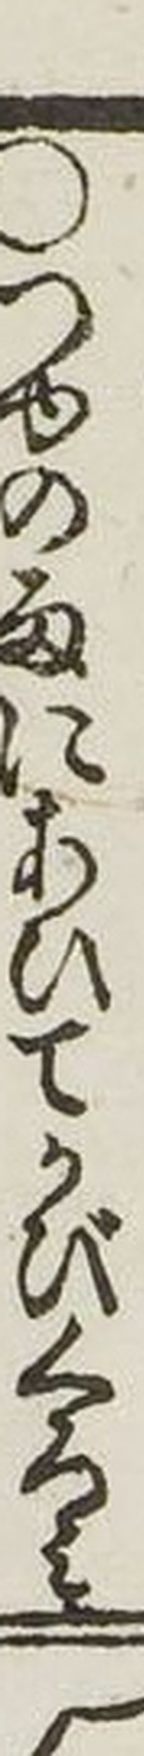〇つゆの雨にあひてかびくろみ
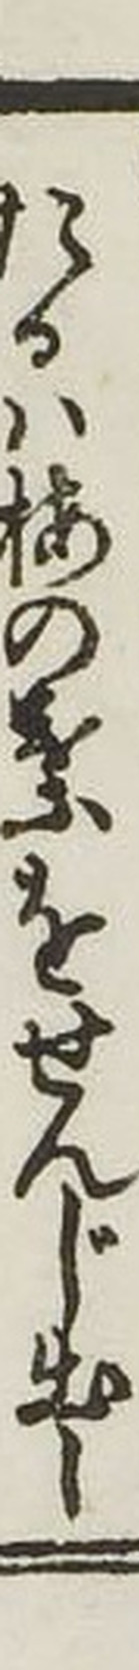たるは梅の葉をせんじ出し
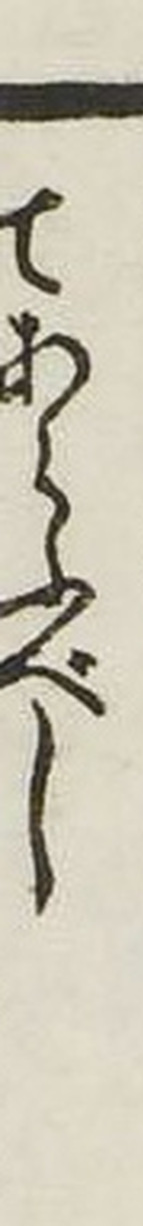てあらふべし
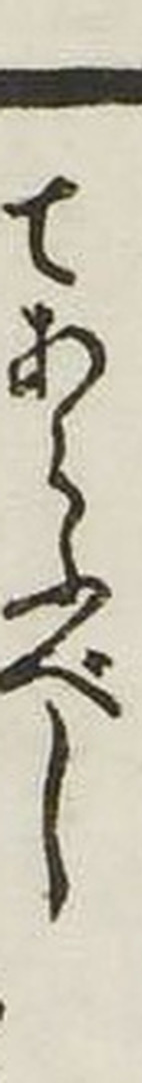てあらふべし
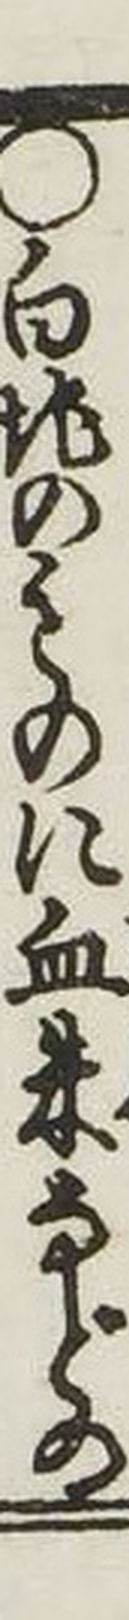〇白地のものに血朱などの
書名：商人書翰便覧
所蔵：東京学芸大学教育コンテンツアーカイブ
